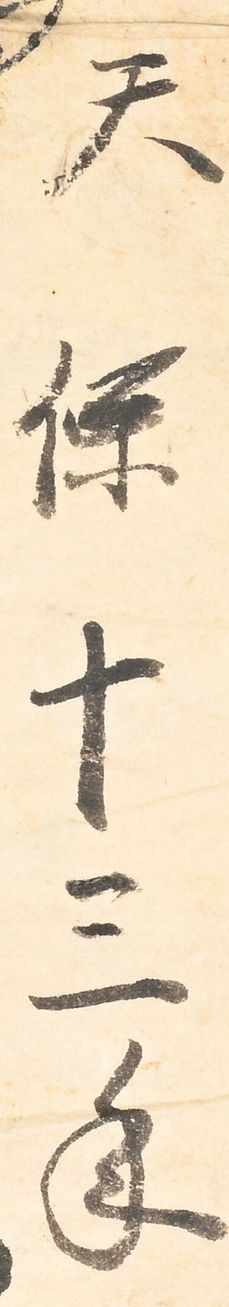天保十三年
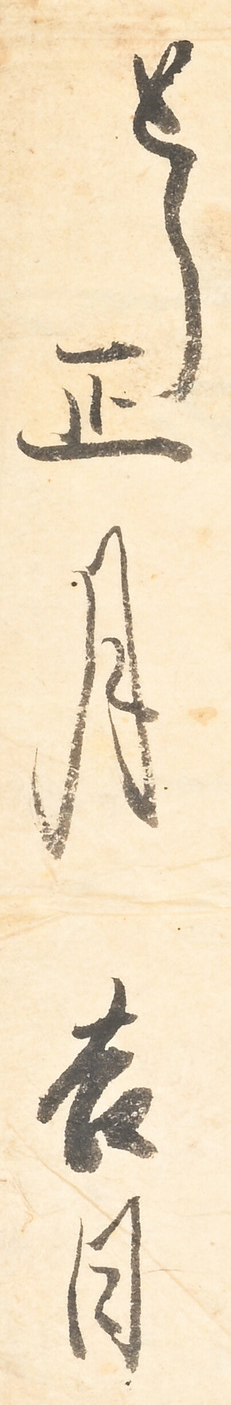とり正月吉日
